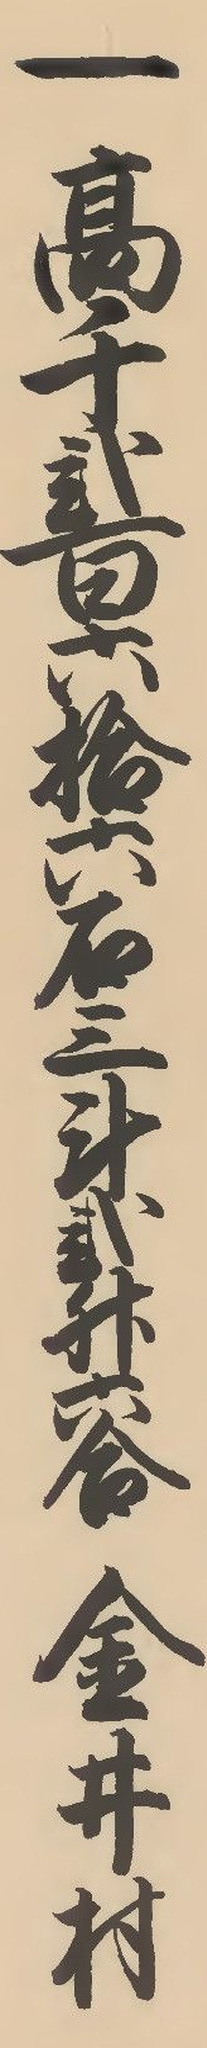一髙千弐百六拾六石三斗弐升六合金井村
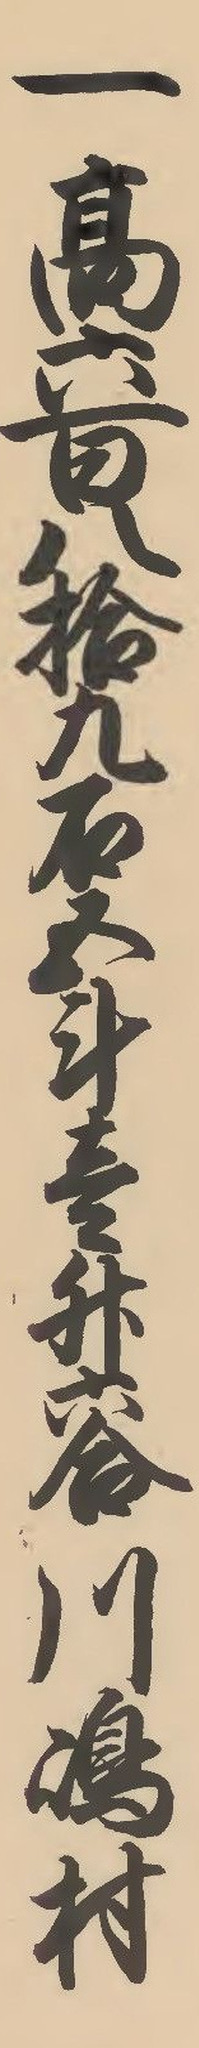一髙六百八拾九石五斗壱升六合川嶋村

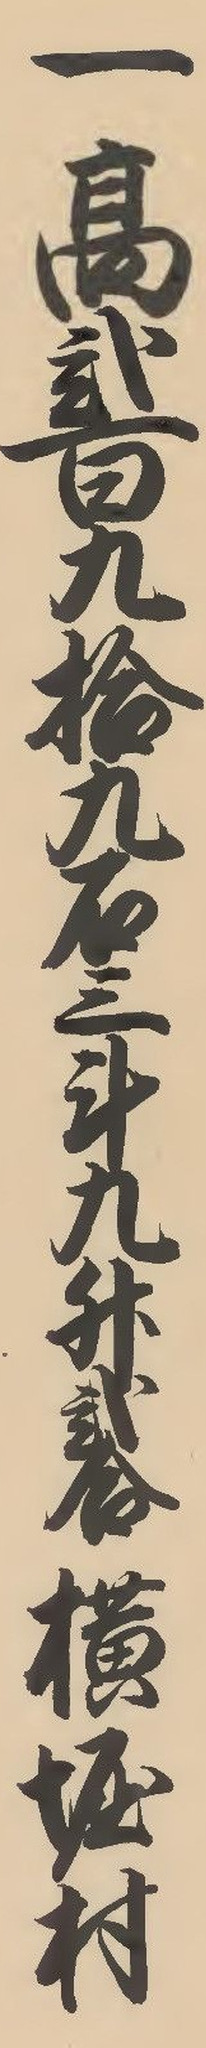一髙弐百九拾九石三斗九升弐合横堀村
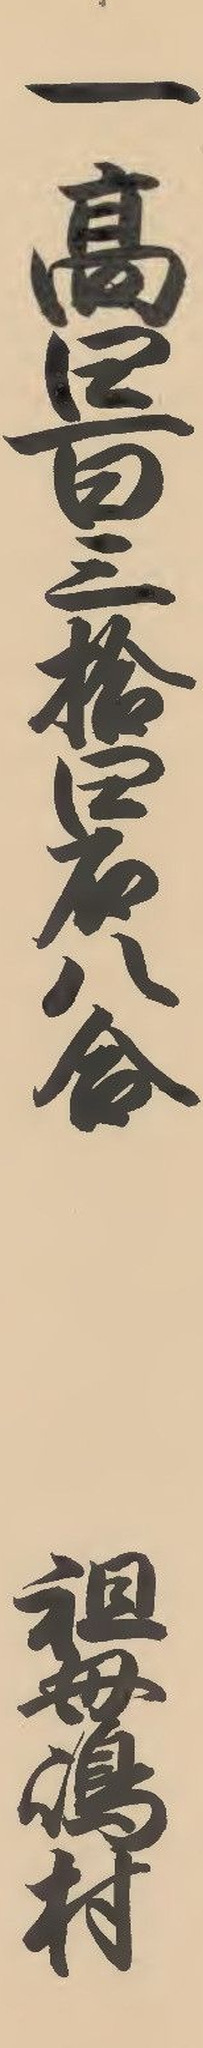一髙四百三拾四石八合祖母嶋村
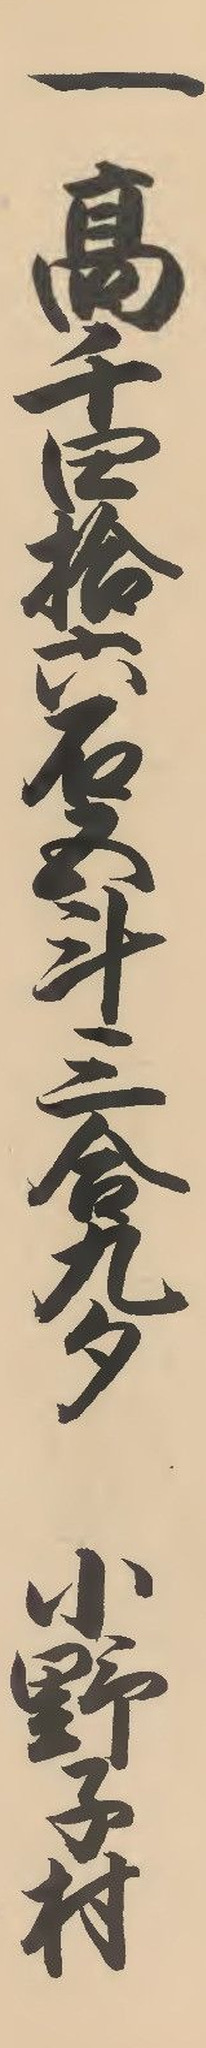一髙千四拾六石五斗三合九夕小野子村
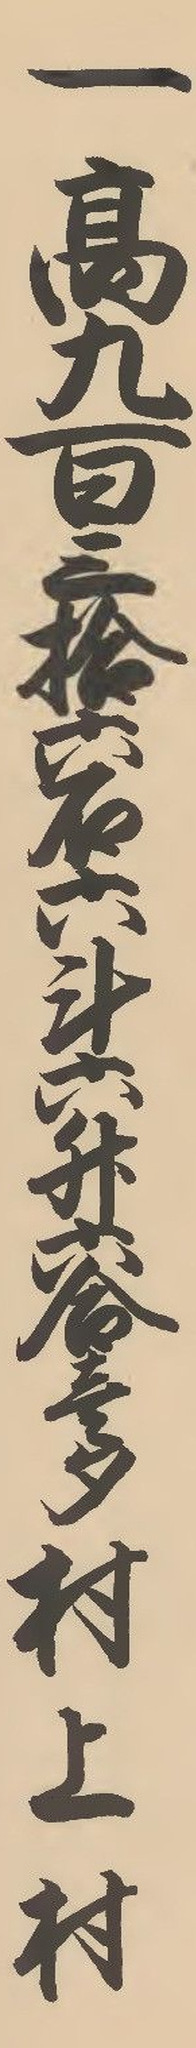一髙九百三拾六石六斗六升六合壱夕村上村
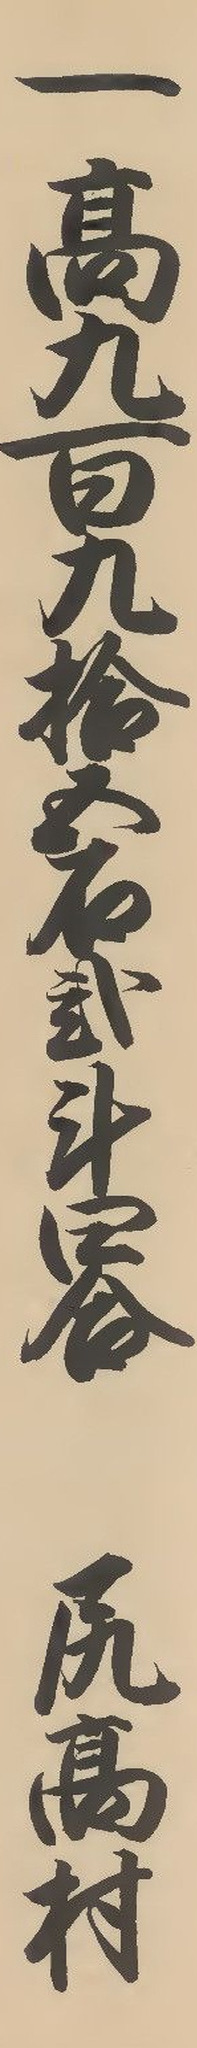一髙九百九拾五石弐斗四合尻髙村
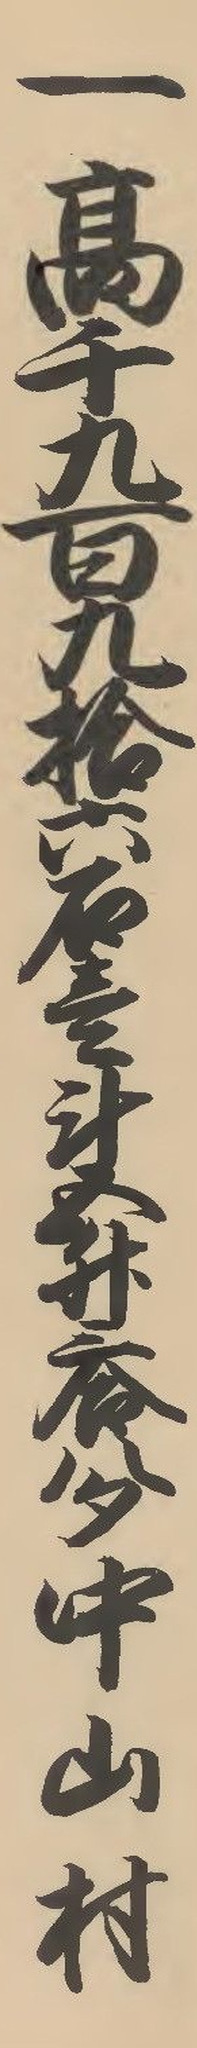一髙千九百九拾六石壱斗五升三合八夕中山村
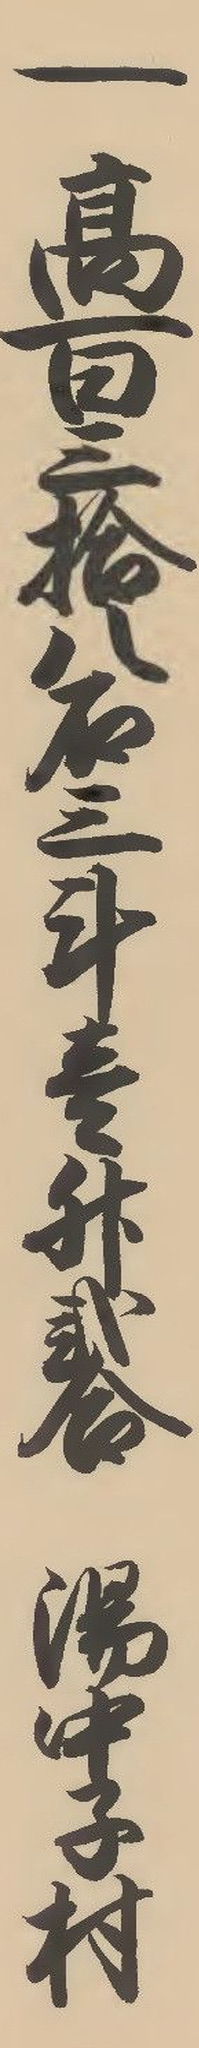一髙百三拾八石三斗壱升弐合湯中子村
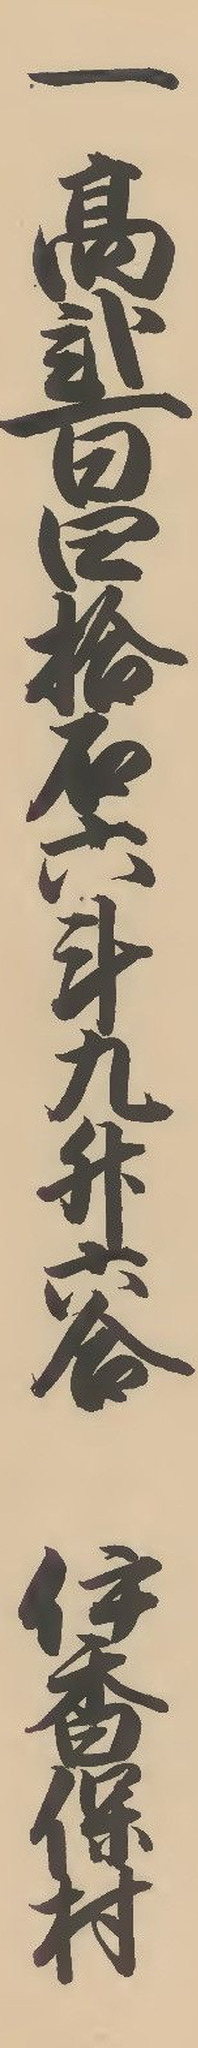一髙弐百四拾石六斗九升六合伊香保村

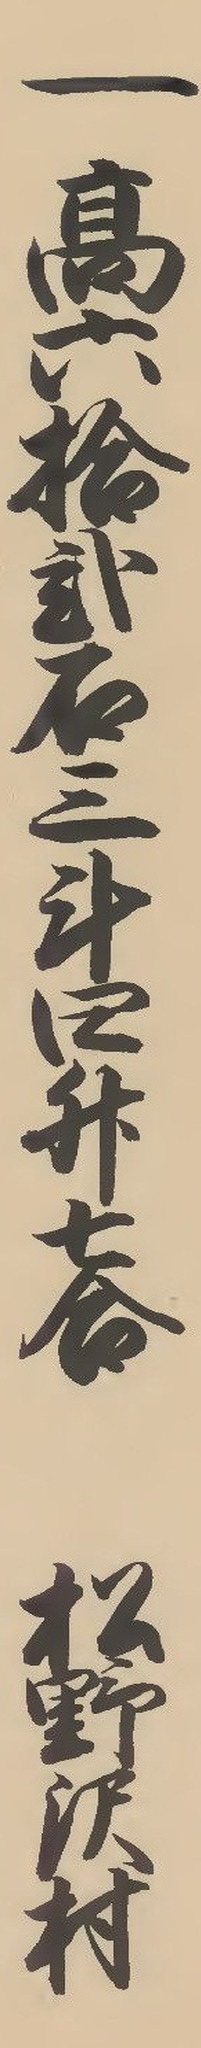一髙六拾弐石三斗四升七合松野沢村
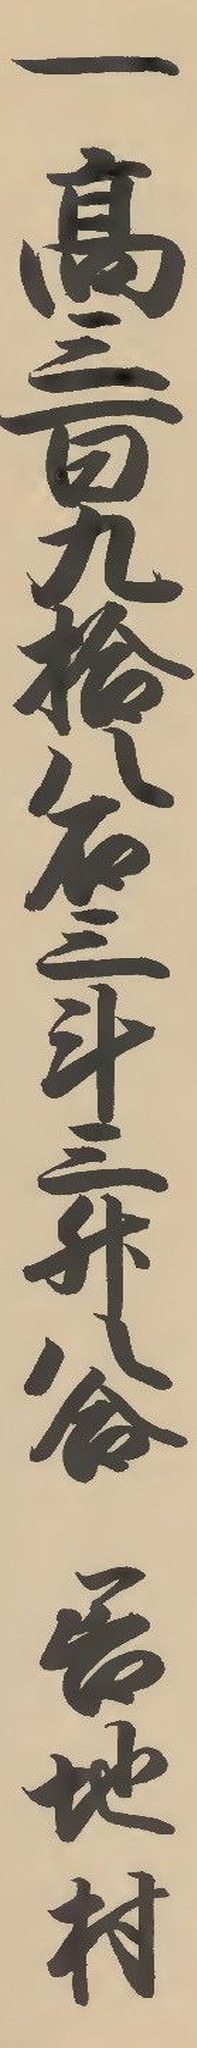一髙三百九拾八石三斗三升八合善地村
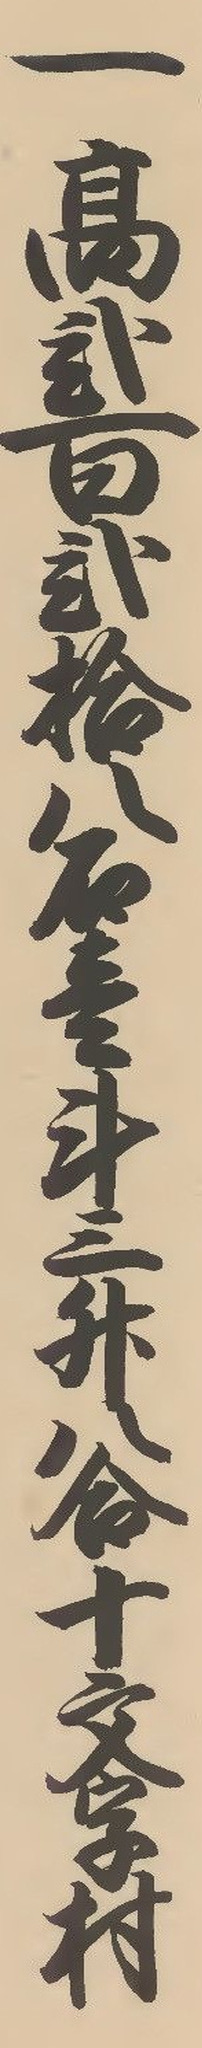一髙弐百弐拾八石壱斗三升八合十文字村
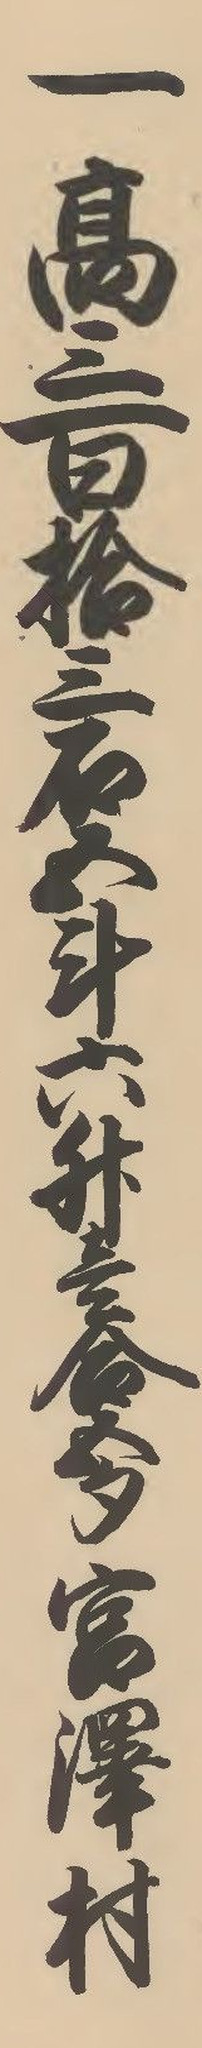一髙三百拾三石五斗六升壱合五夕宮澤村
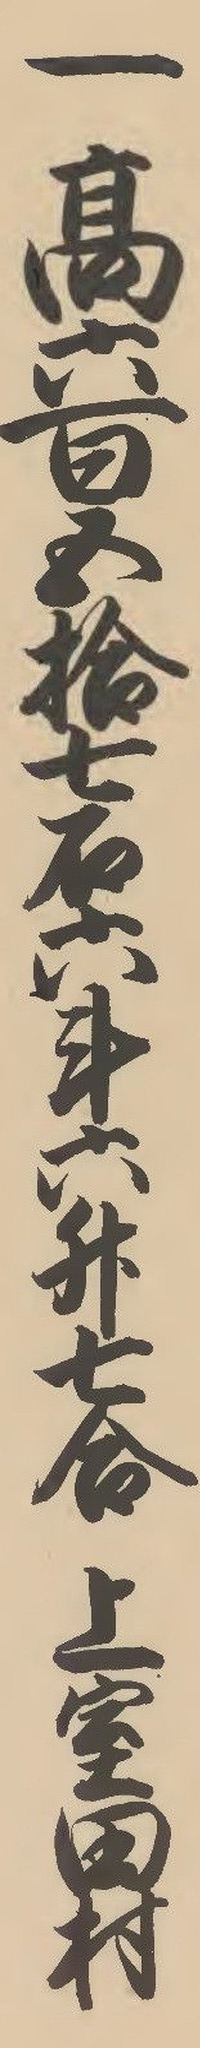一髙六百五拾七石六斗五升七合上室田村
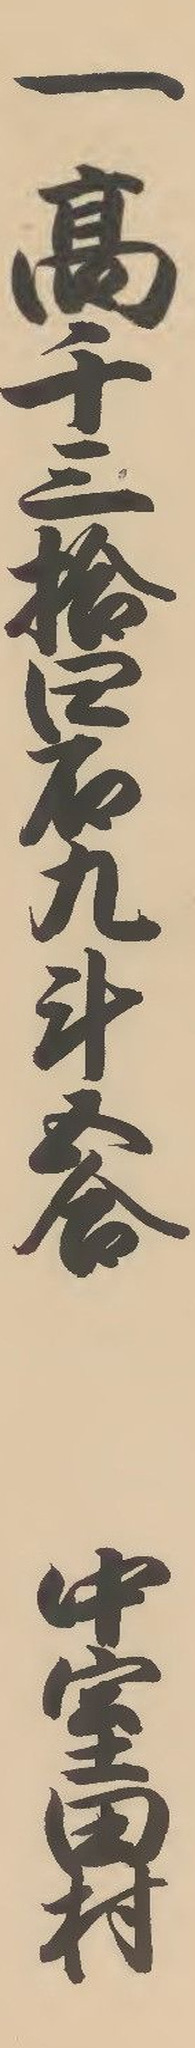一髙千三拾四石九斗五合中室田村
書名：上野国郷帳
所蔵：国立公文書館 National Archives of Japan
